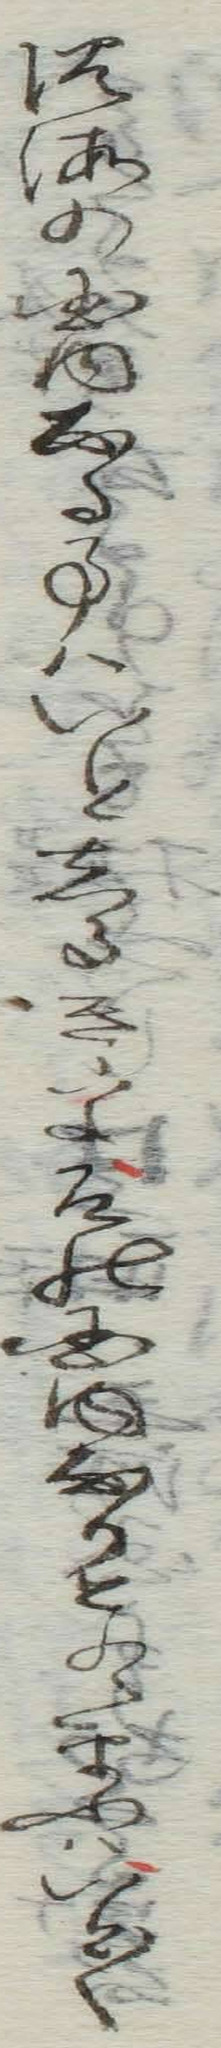淡海の国内なる事はいとしるきを、その国内なりとのたまふは、いと〳〵
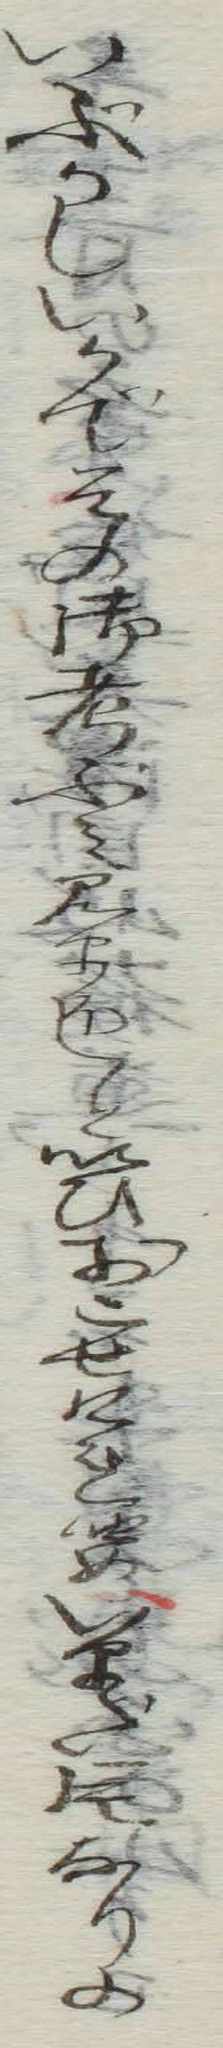いぶかしいかでその御考ぶみ見まほしといひおこせければ、いまだ片なりの
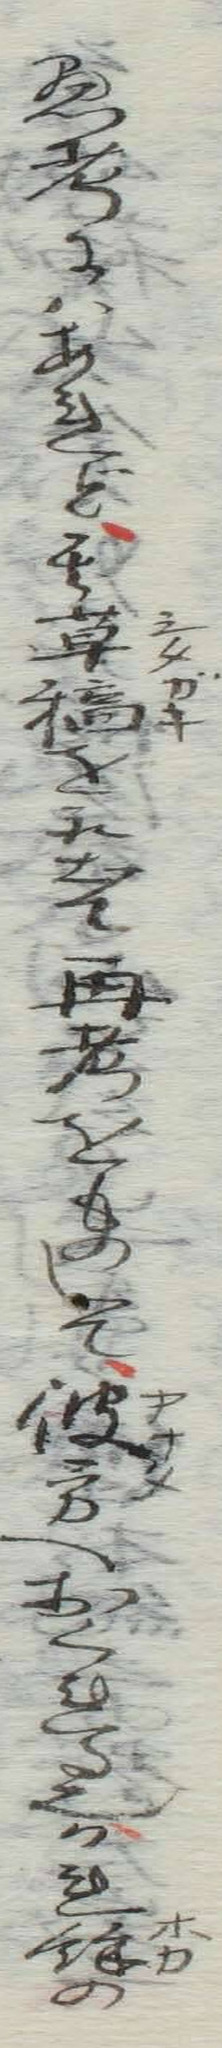愚考にはあれど、其草稿を取出て再考をものして、彼方へおくれる也、かれ余の
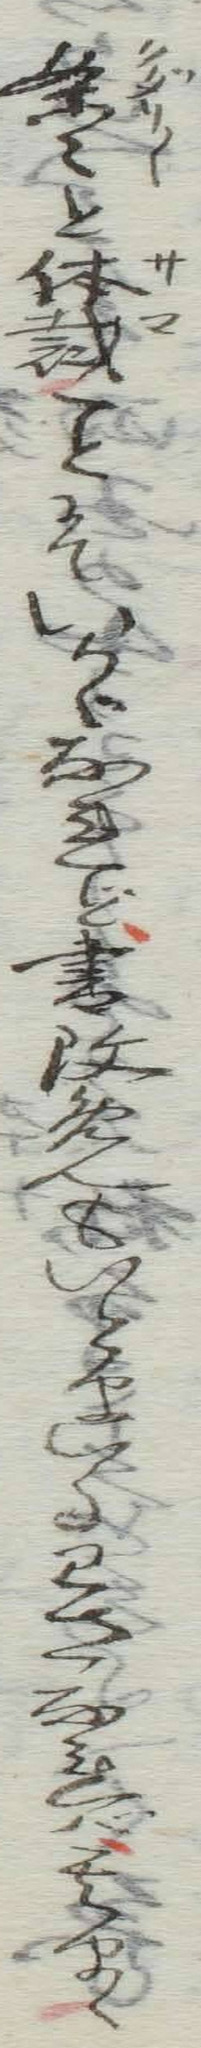条々と体裁ことにていかゞなれど、書改めんもいとまいるわさなれば、其まゝ
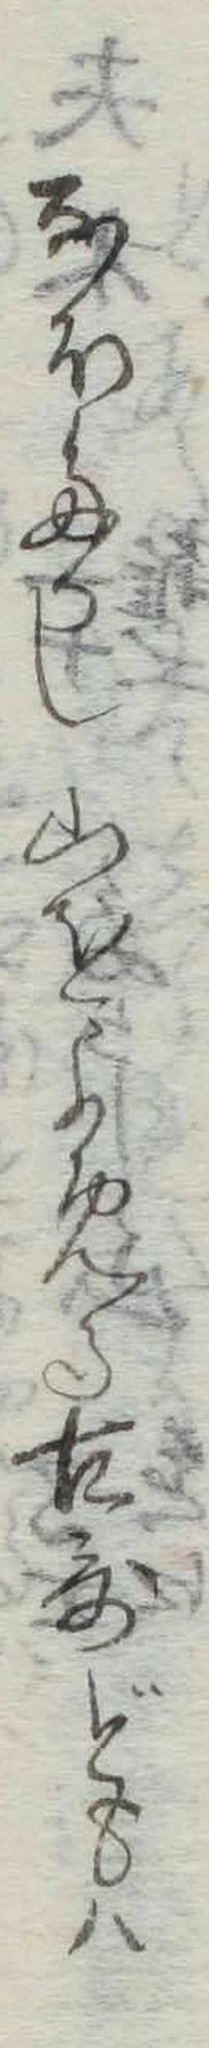なほたかし山をよめる古歌どもは
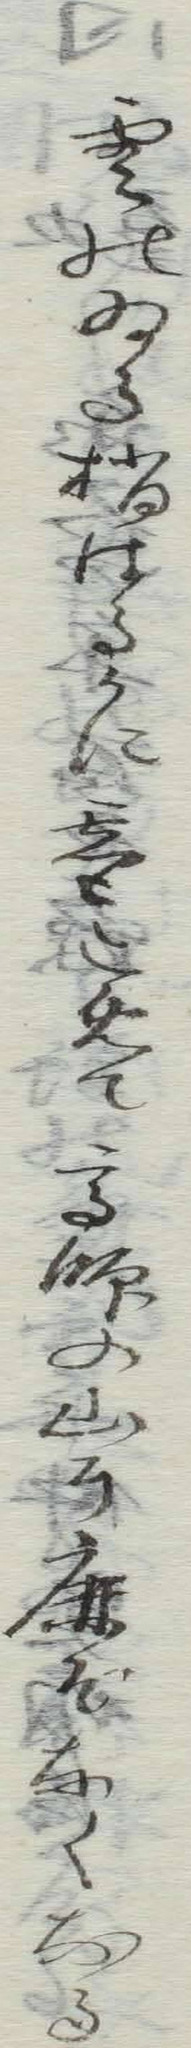雲のゐる梢はるかに霧こめて高師の山に鹿ぞなくなる名
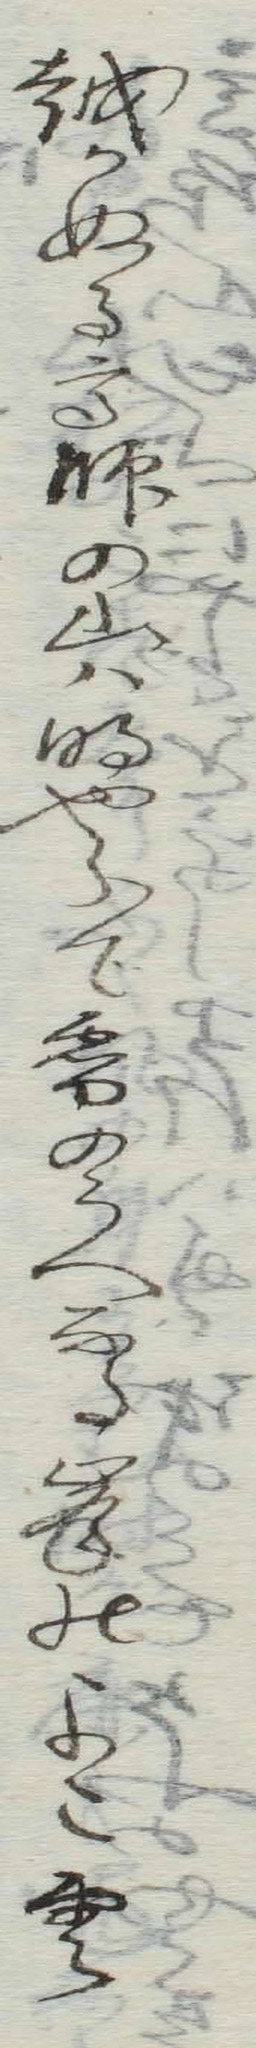越かぬる高師の山は明やらで霧のうへなる峰のよこ雲
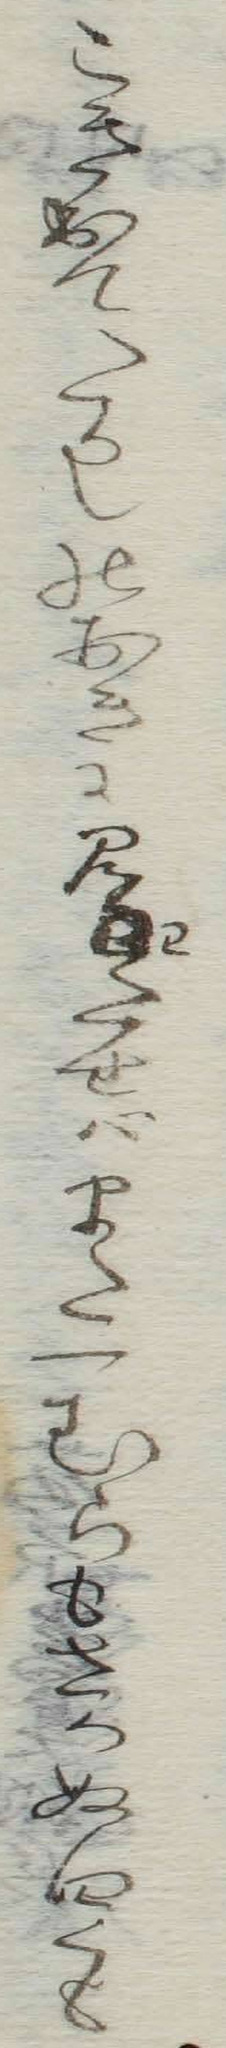こき出てたかしのおきに見わたせばまた一むらもさかぬ白くも
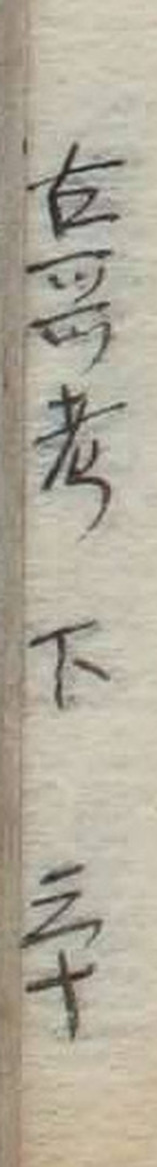古歌考下三十

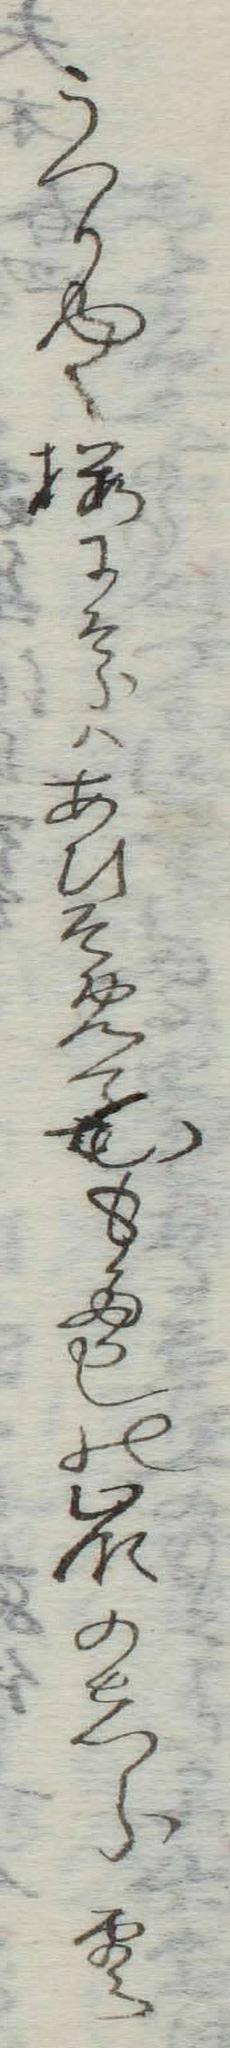うつりゆく桜にそらはあひそめて花もたかしの嶺のしら雲
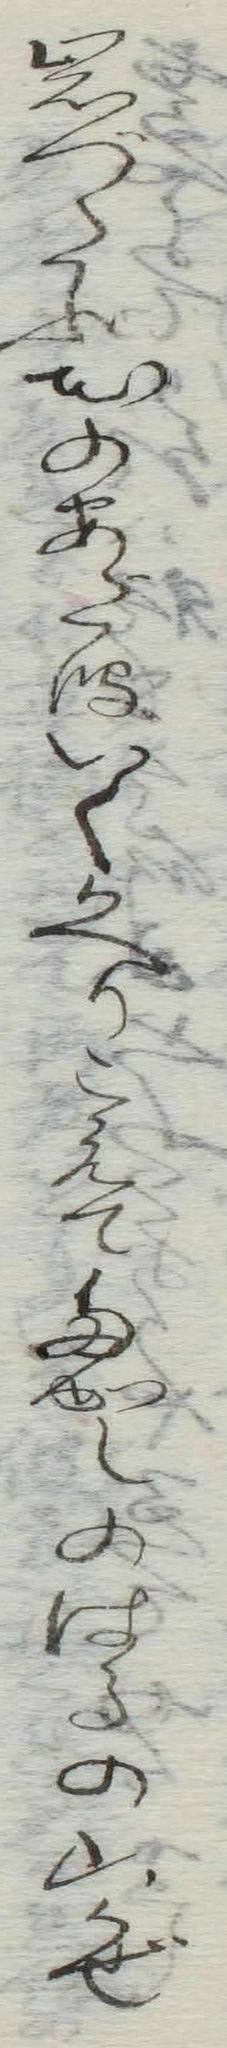岩づたふ花のあだ波いくかえりこえてたかしのはるの山かぜ
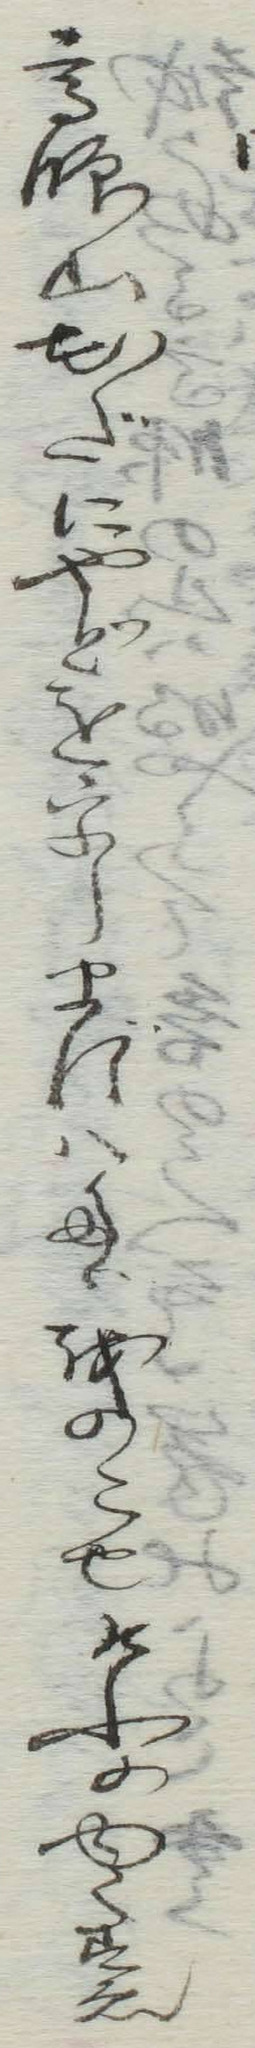高師山花だにやどををしまずはただ越のこせけふのゆくすゑ
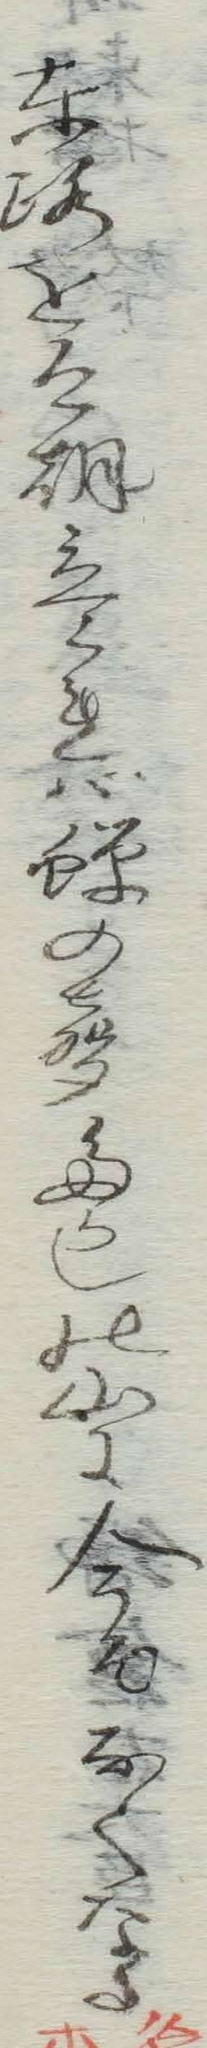東路を今朝立くれば蝉の声たかしの山に今ぞなくなる名ホ
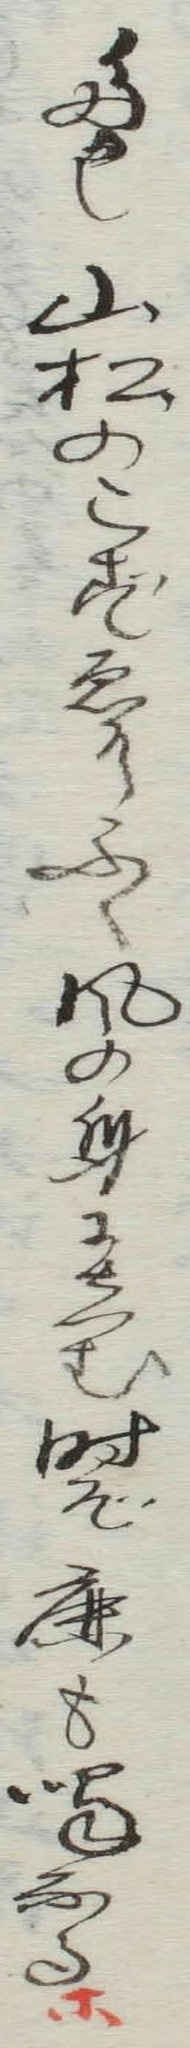たかし山松のこずゑにふく風の身にしむ時ぞ鹿も鳴なるホ
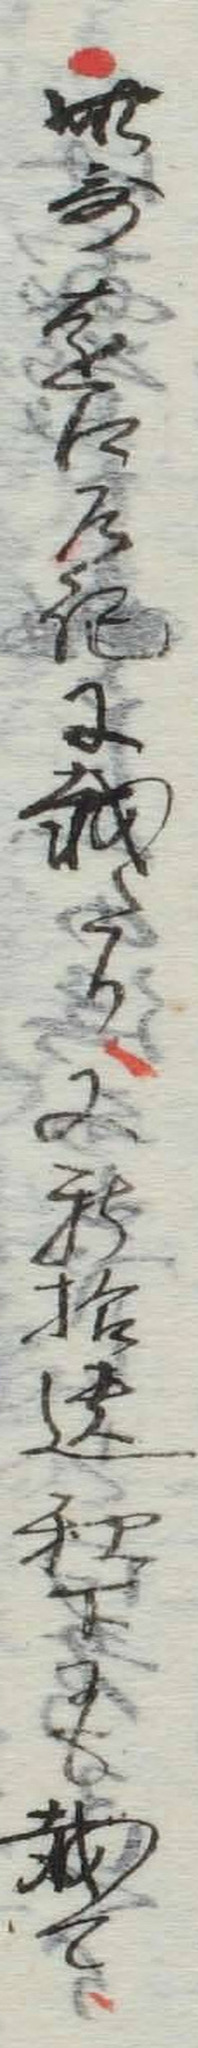●此歌遠江道記に載たり、又新拾遺秋下にも載て、
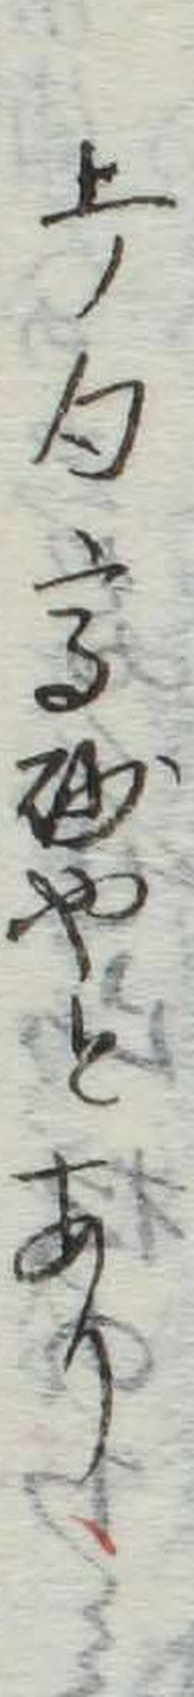上ノ句高砂やとあり、
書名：三河国古跡考
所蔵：国文学研究資料館
